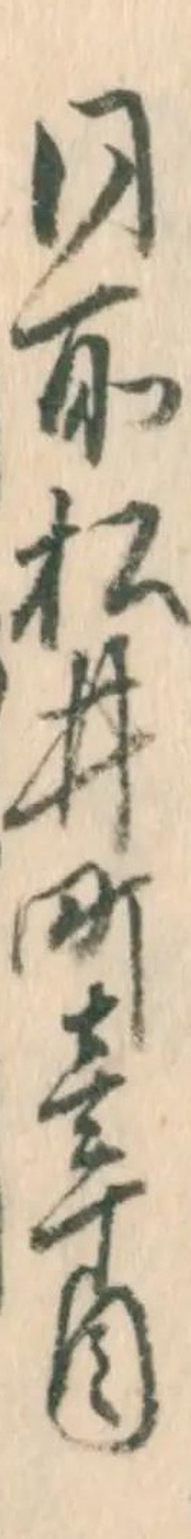同所松井町壱丁目
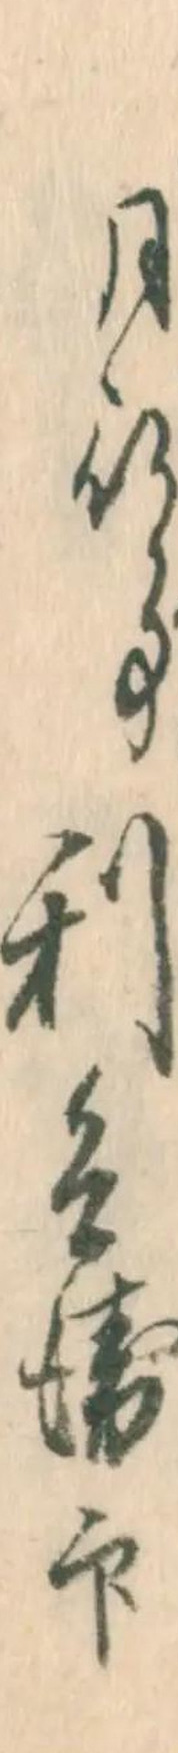月行事利兵衛印

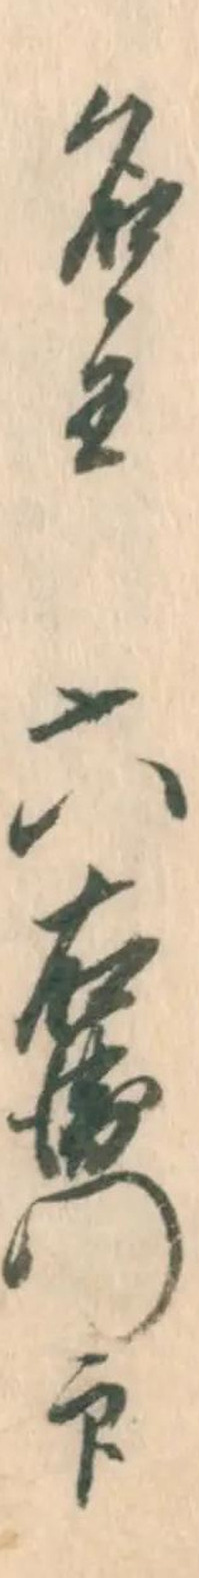名主六右衛門印
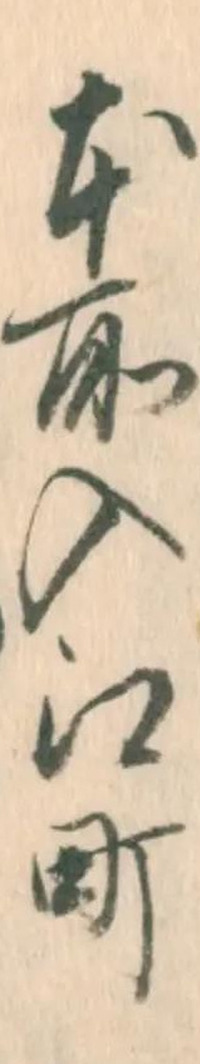本所入江町
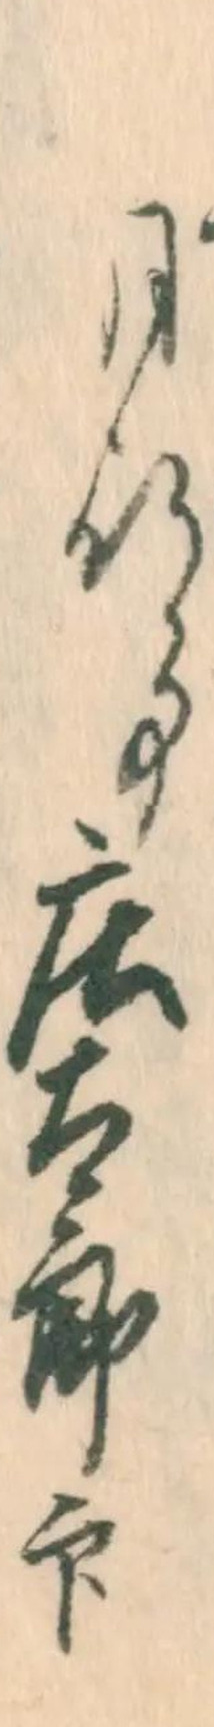月行事庄太郎印
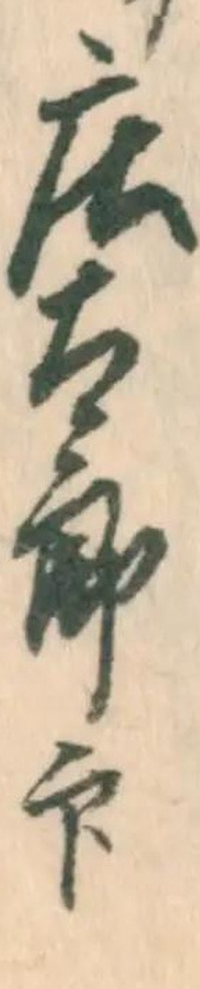月行事庄太郎印
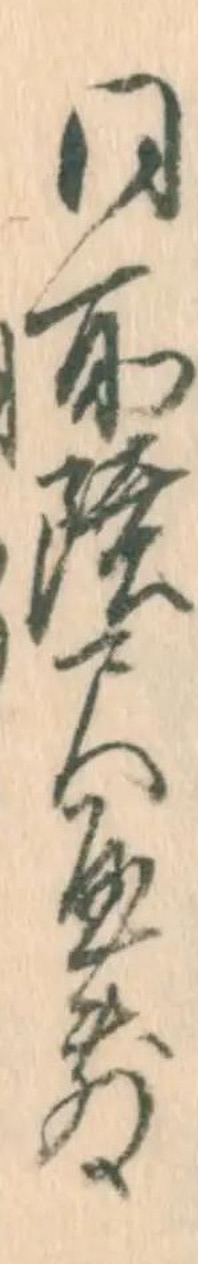同所陸尺屋敷
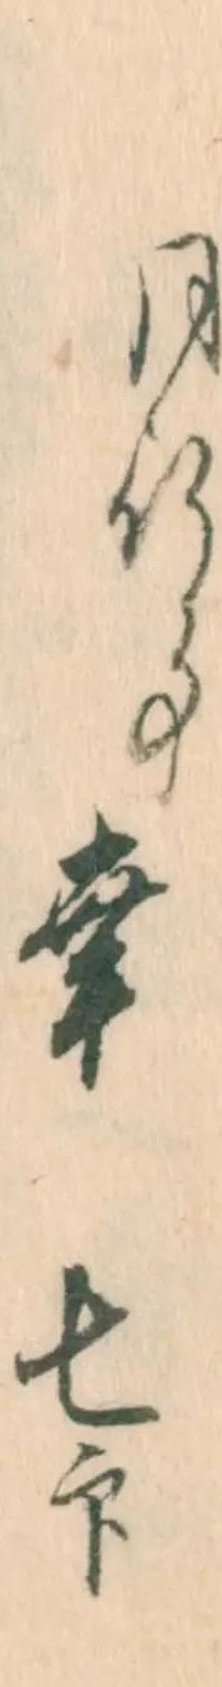月行事幸七印
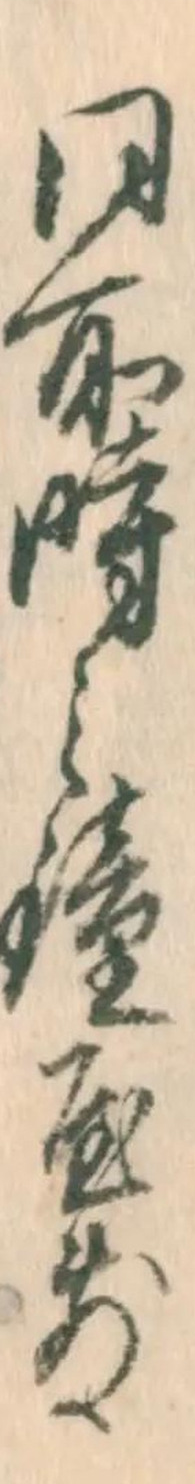同所時之鐘屋敷
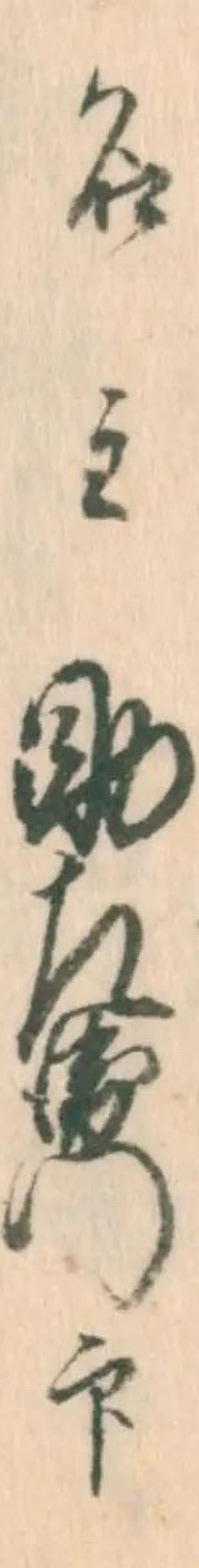名主助左衛門印
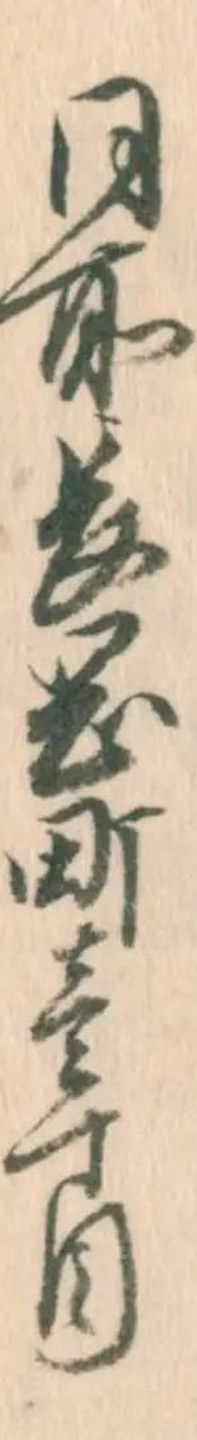同所長岡町壱丁目
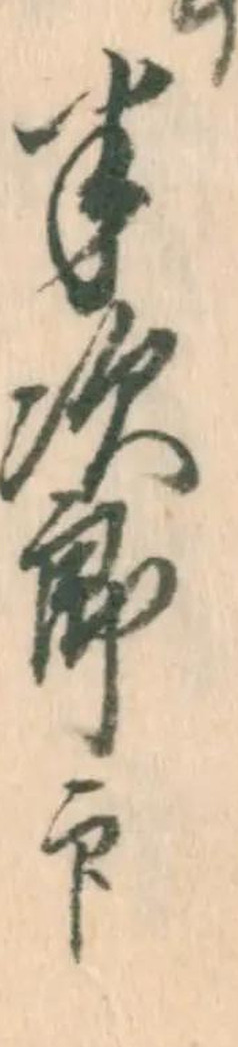月行事半次郎印
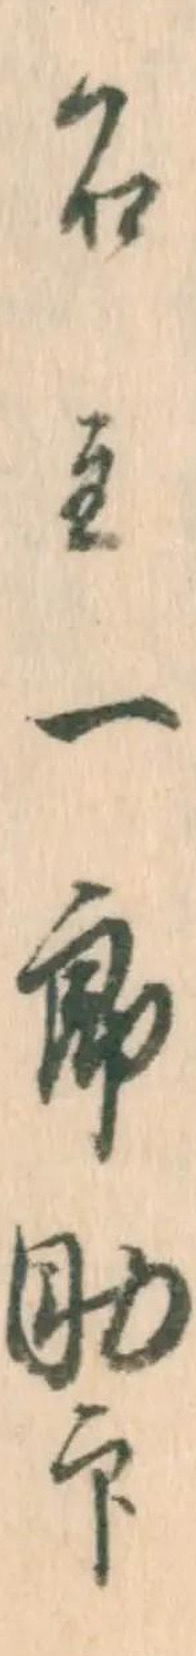名主一郎助印
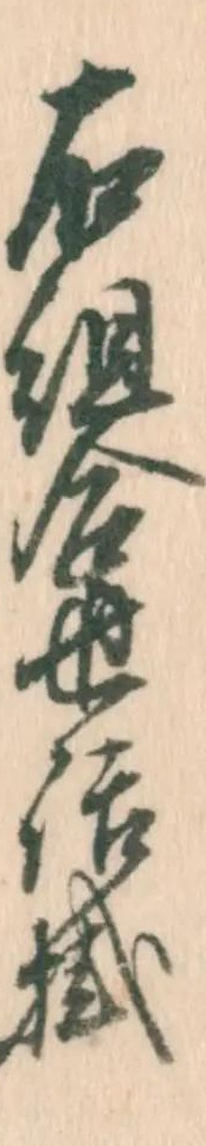右組合世話掛
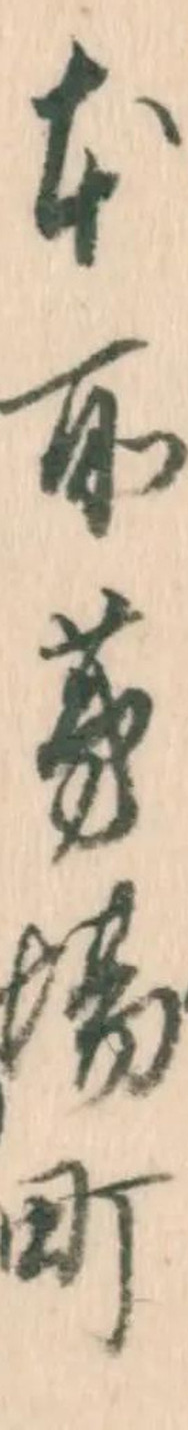本所茅場町
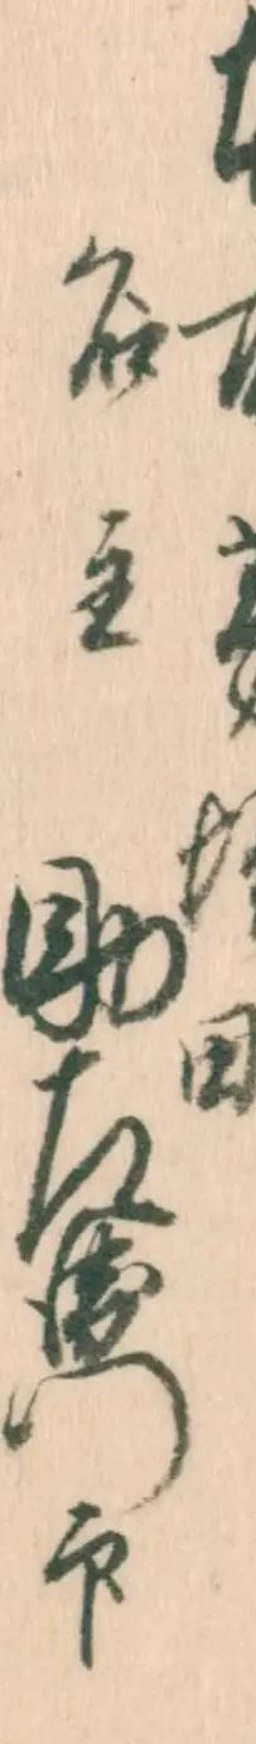名主助左衛門印
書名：地震災書留 2巻. [2] 内表紙に「地震一件　安政二卯年十月」とあり
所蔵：国立国会図書館 National Diet Library, JAPAN
